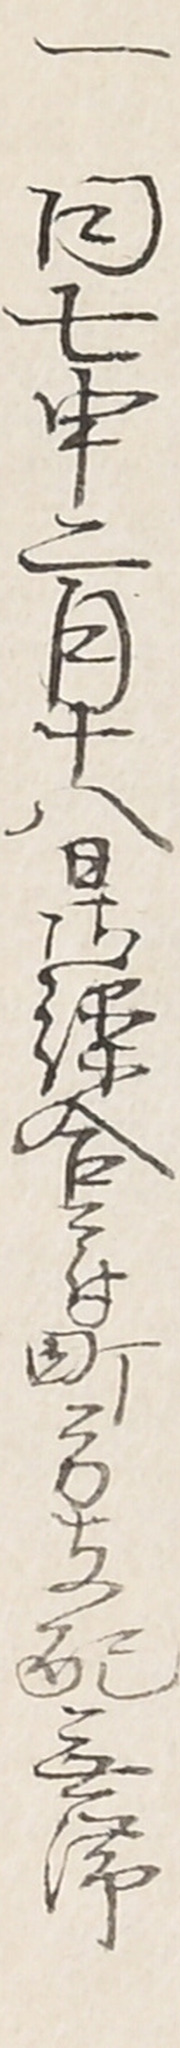一同七申二月十八日御繰合ニ付町方支配無滞
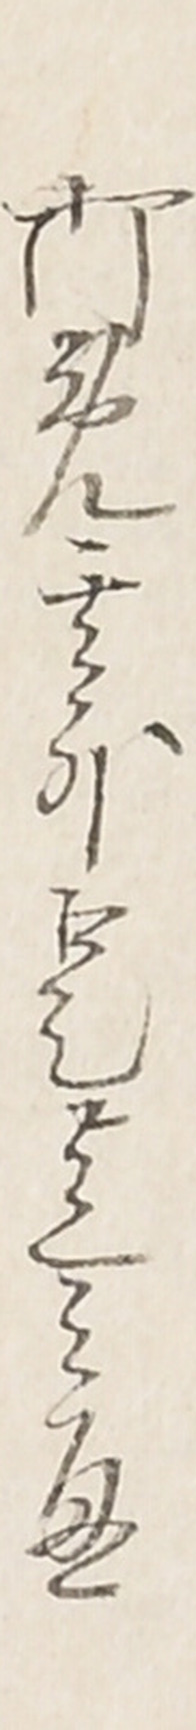御免其外是迄之通
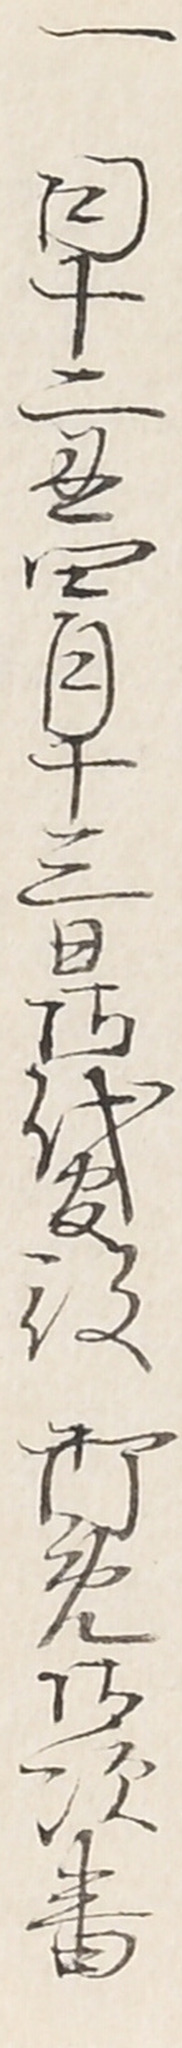一同十二丑四月十三日御代官役御免御次番
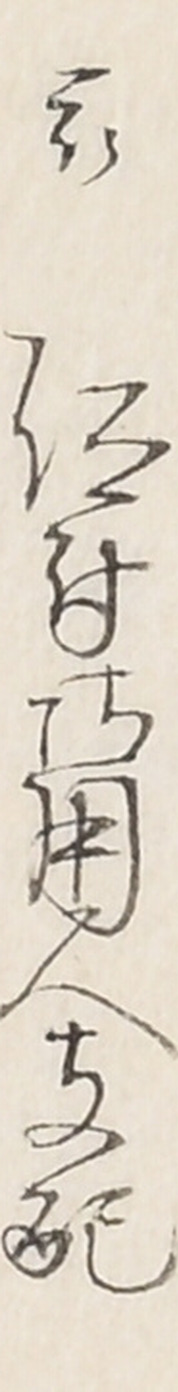被仰付御用人支配
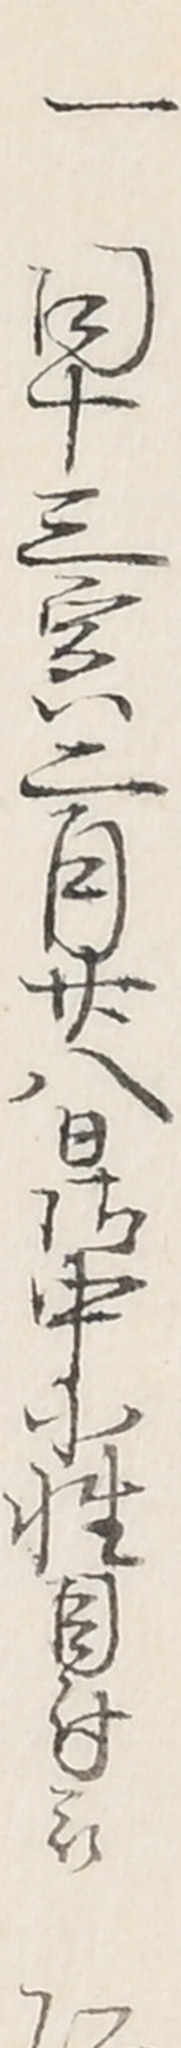一同十三寅二月廿八日御中小性目付被仰付
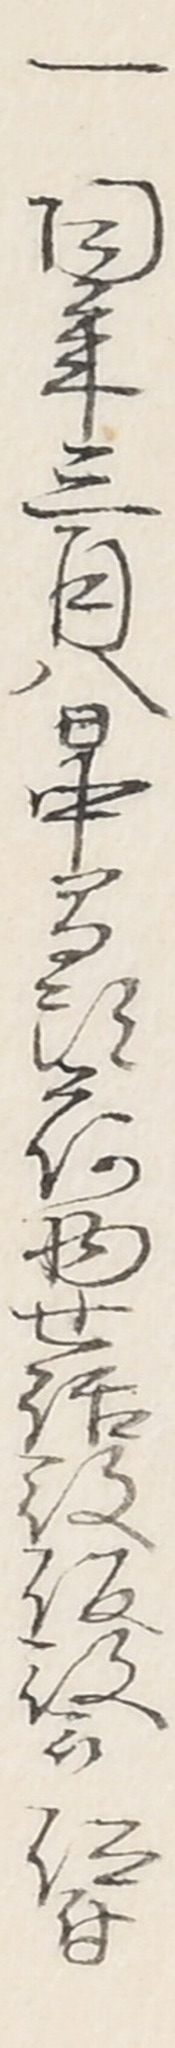一同年三月八日中間頭荷物世話役仮役被仰付
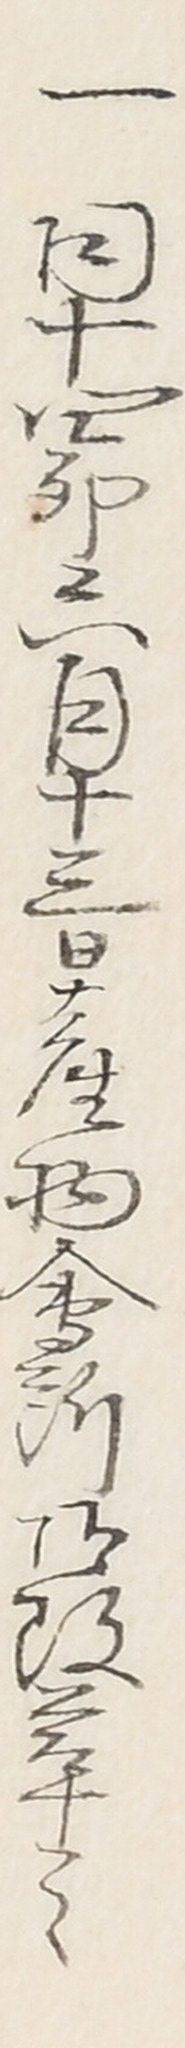一同十四卯六月十三日産物会所御改革之
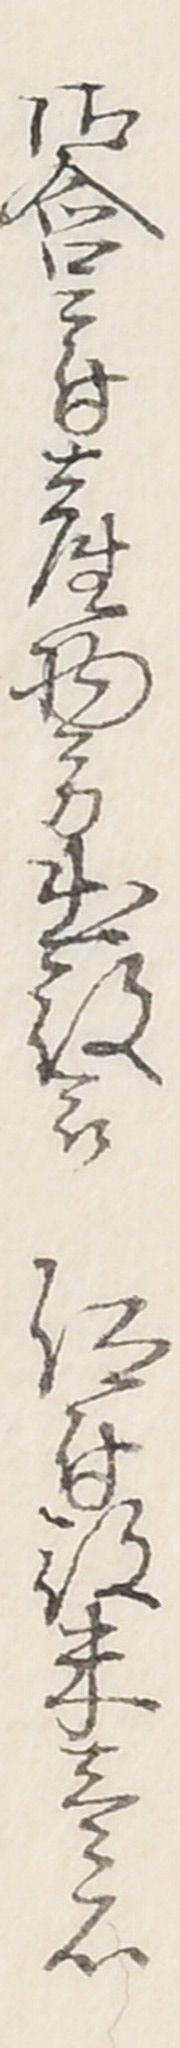御含ニ付産物方出役被仰付役米壱石
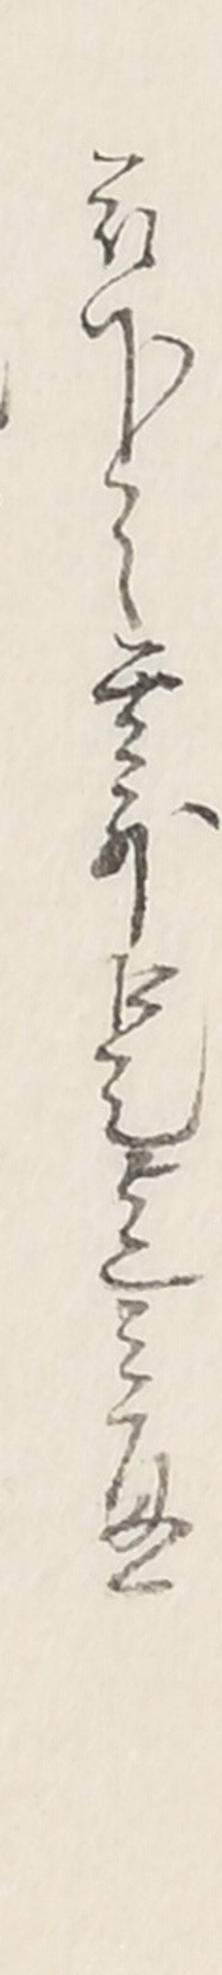被下之其外是迄之通
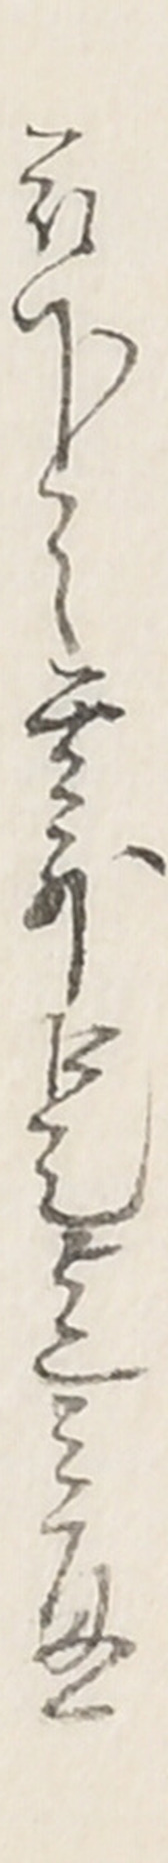被下之其外是迄之通
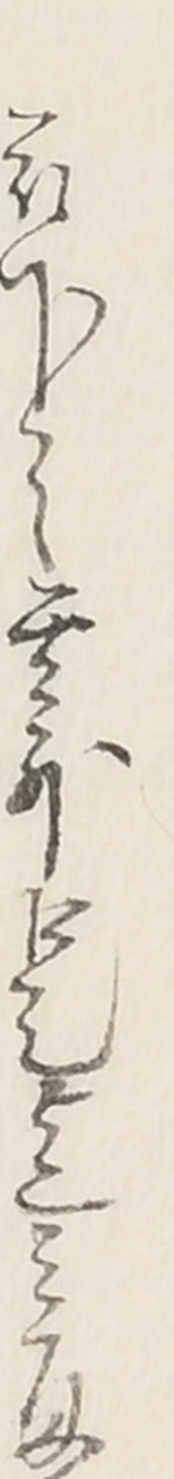被下之其外是迄之通
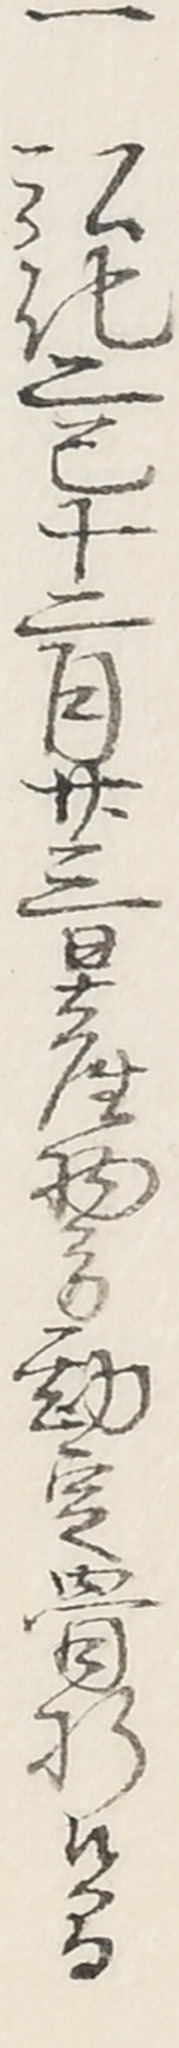一弘化二巳十二月廿三日産物方勘定骨折候間
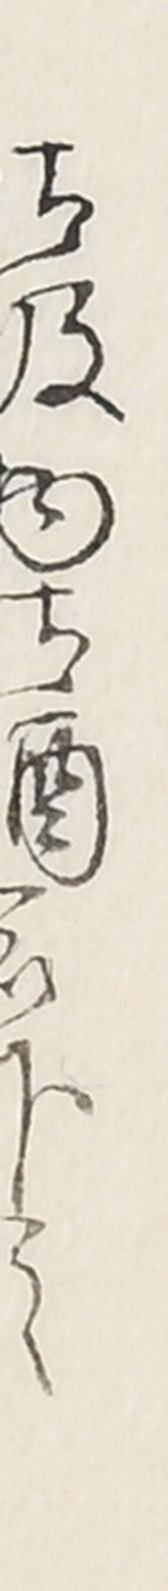御吸物御酒被下之
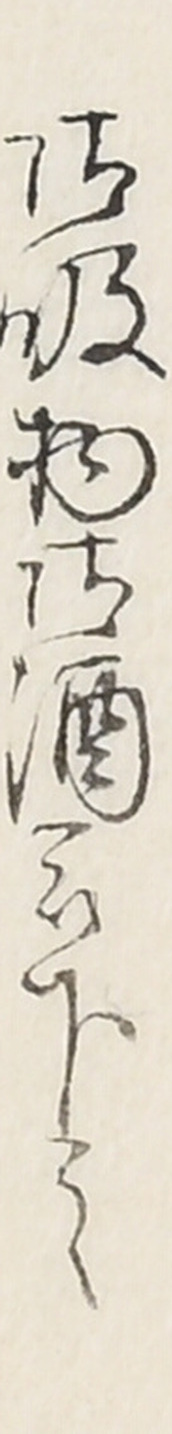御吸物御酒被下之
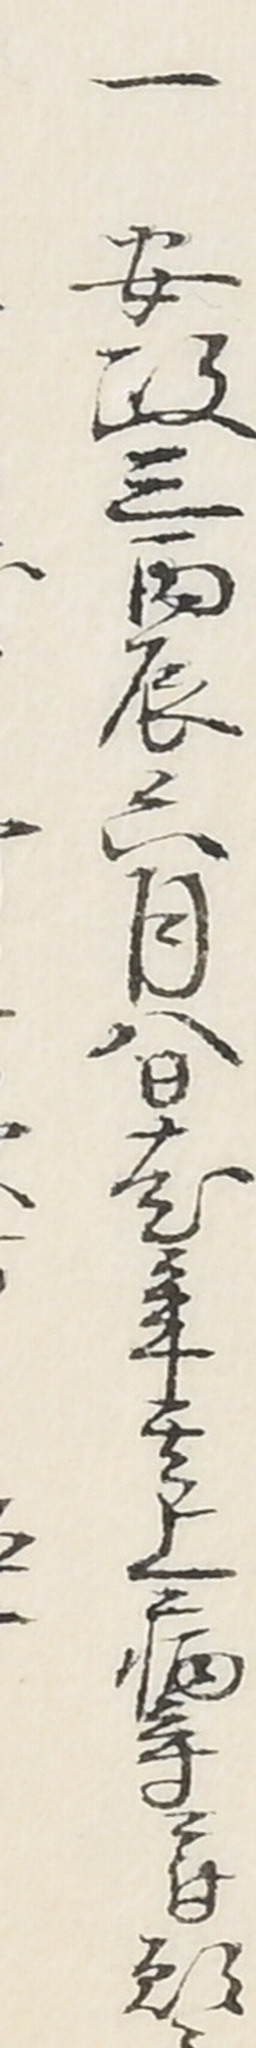一安政三丙辰六月八日老年其上病気ニ付願之
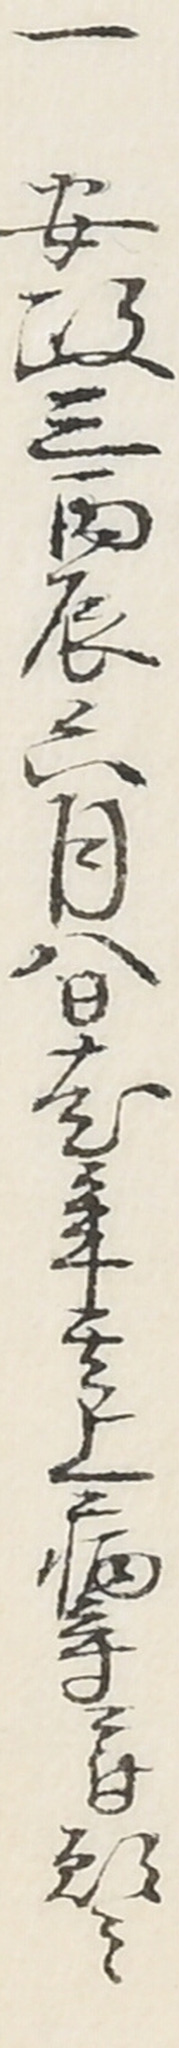一安政三丙辰六月八日老年其上病気ニ付願之
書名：無足諸士勤仕録（四）
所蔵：伊那市立高遠町図書館・合同会社AMANE
